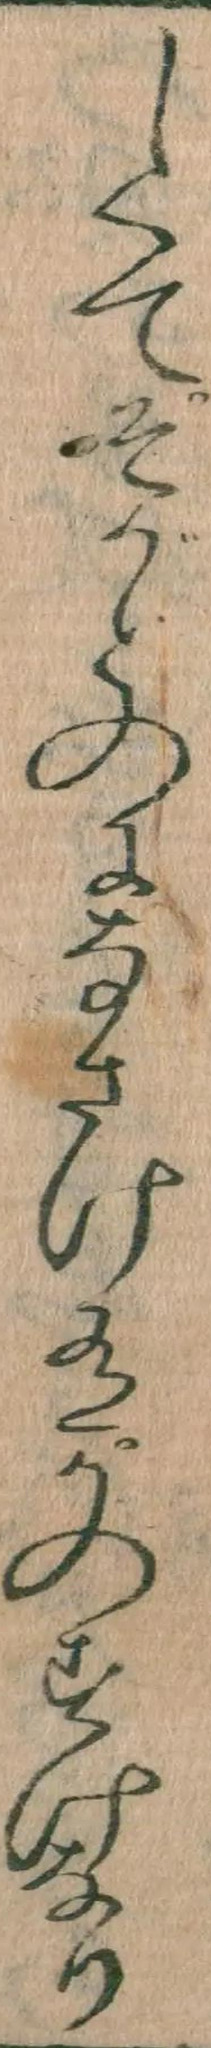しくて。そがとのになさけ有。かのすけなり
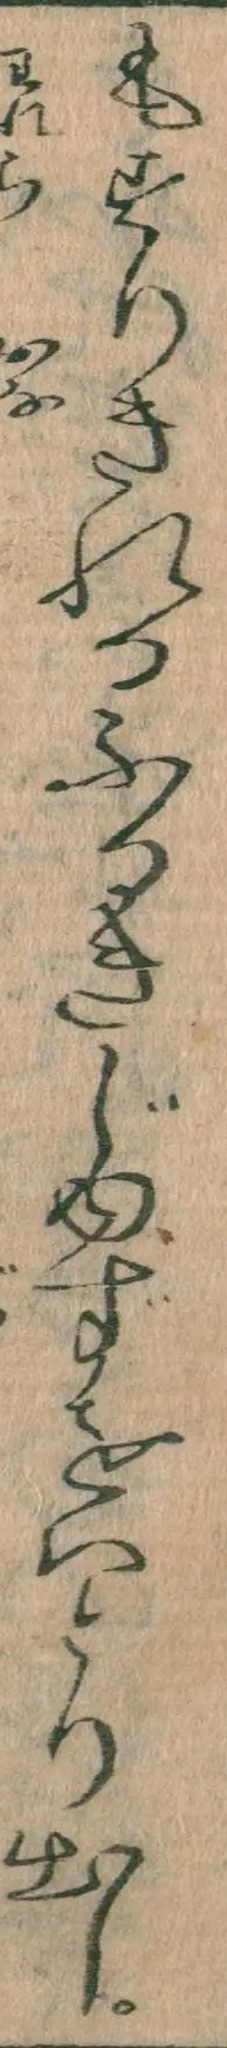もすりきれるふるきじゆずをはとり出し。
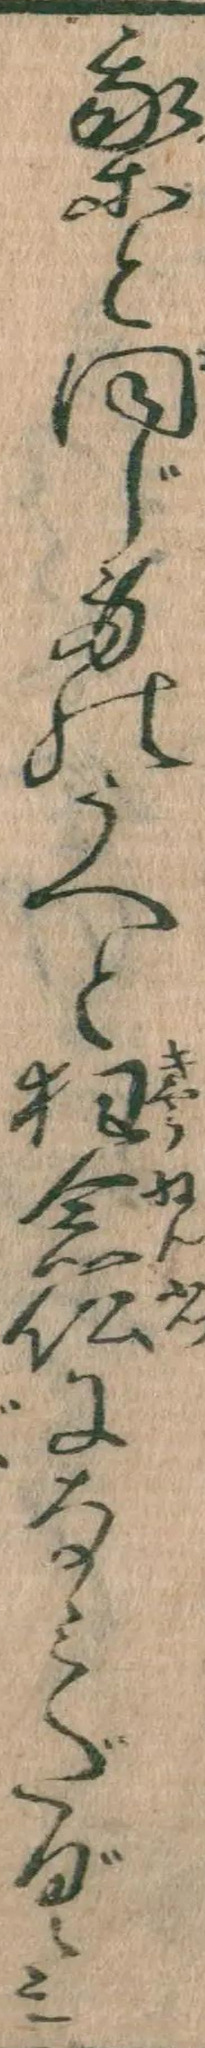我等と同じ身のうへと狂念仏になみだぐみ
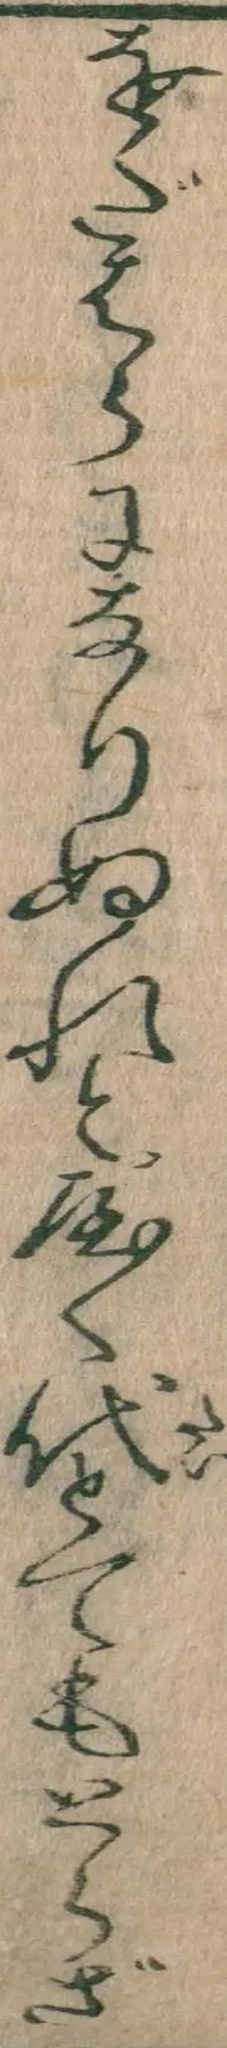をだはらになりぬれと。やく代とてもとらざ
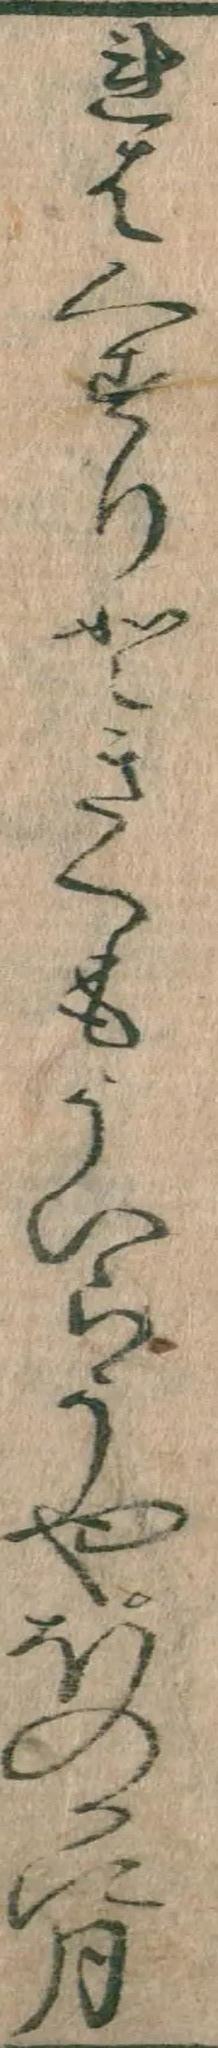れはくすりときくもういらうや。ほのかに月
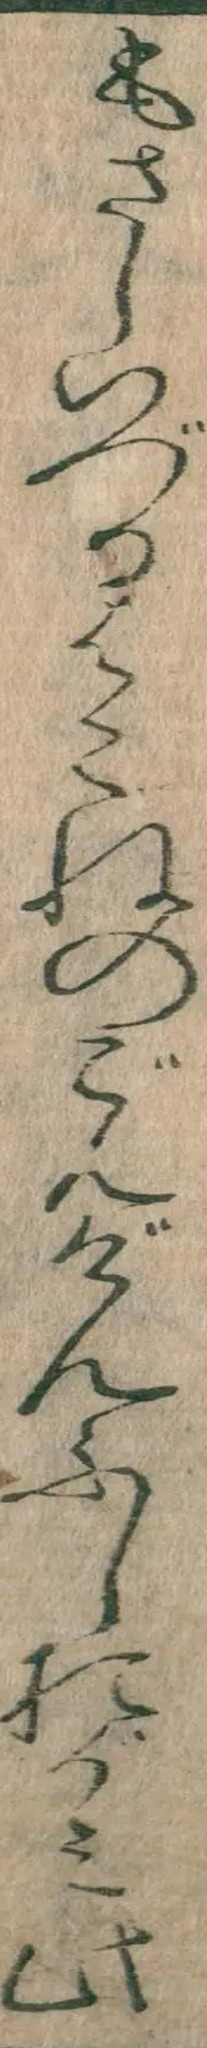もさしいづるはこねのごんげんふしおがみ此
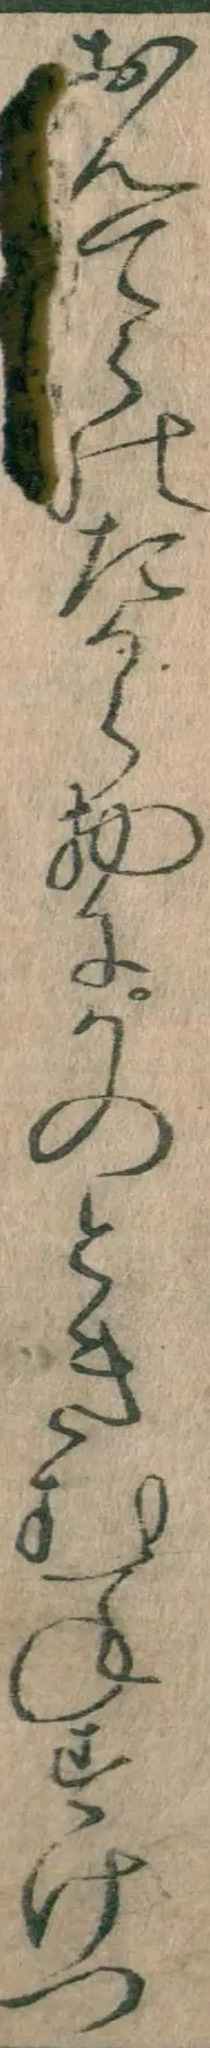おんてらのたから物に。かのときむねすけつ
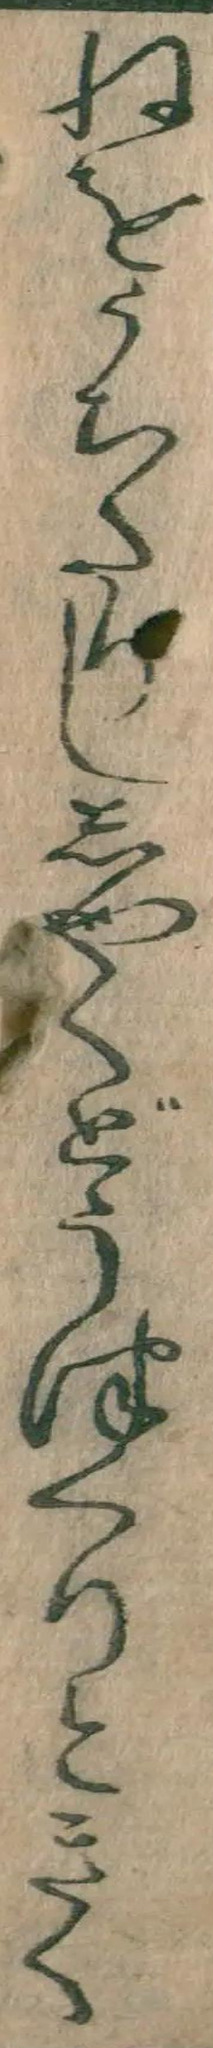ねをうちたりししやくどうつくりときく

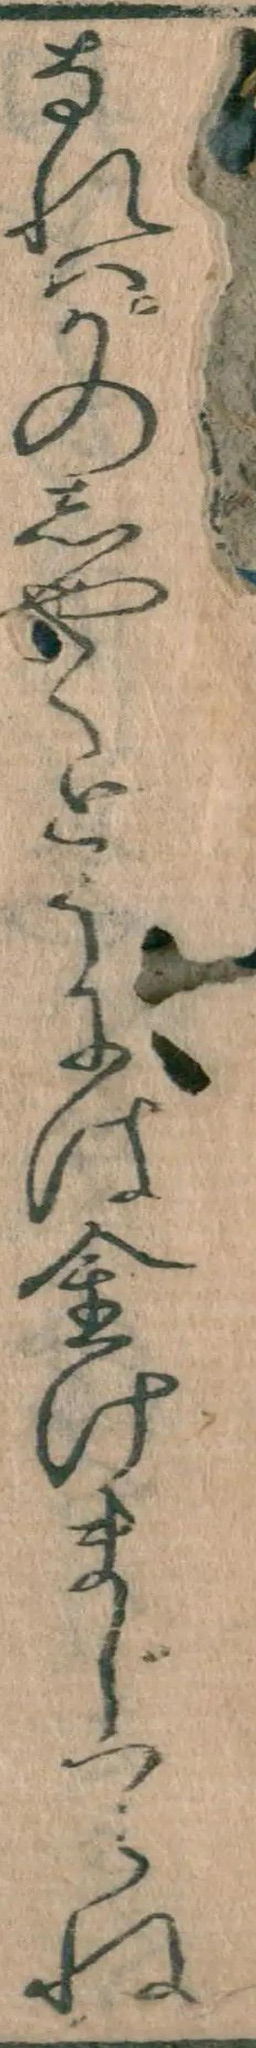なれは。かのしやくとうには金けまじはらね
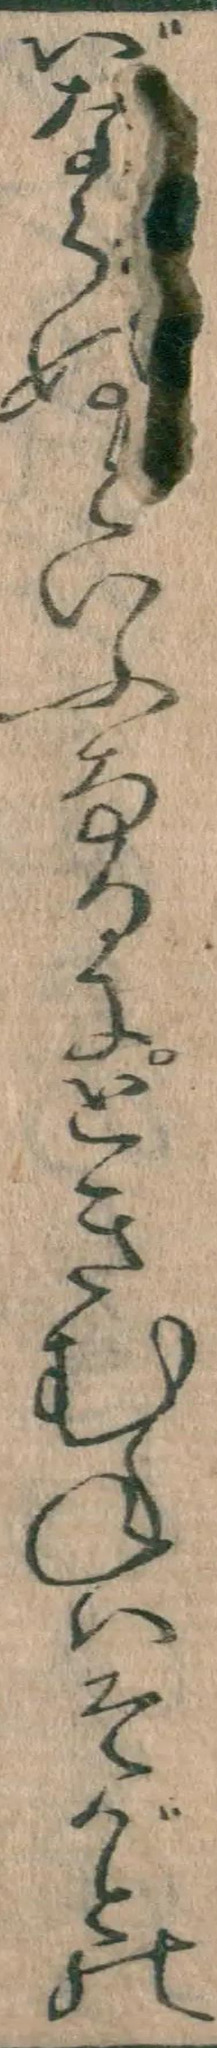ばならぬといふなるに。ときむねはそがとの
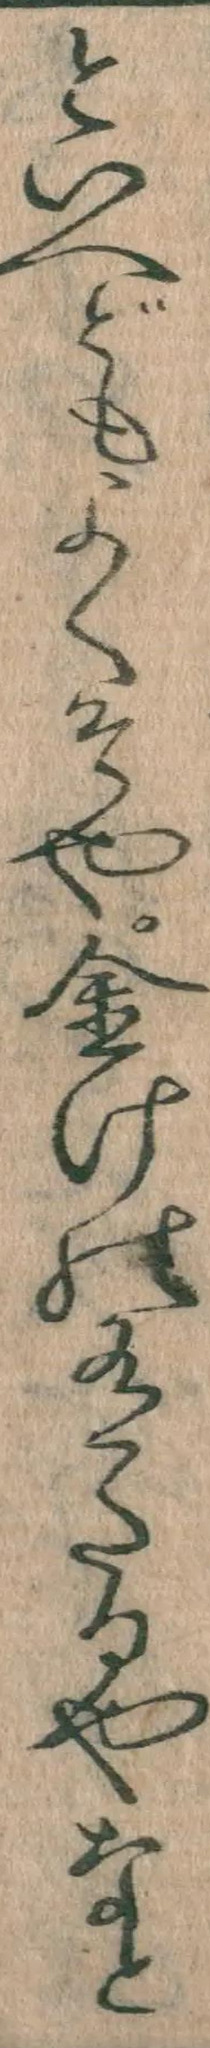といへどもよくそや。金けの有たるやなと
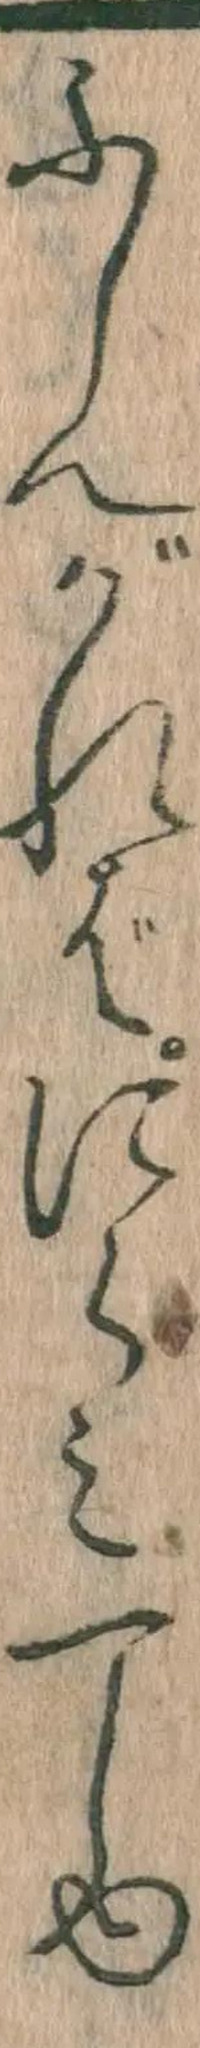ふしんがれば。にらみ一しゆ
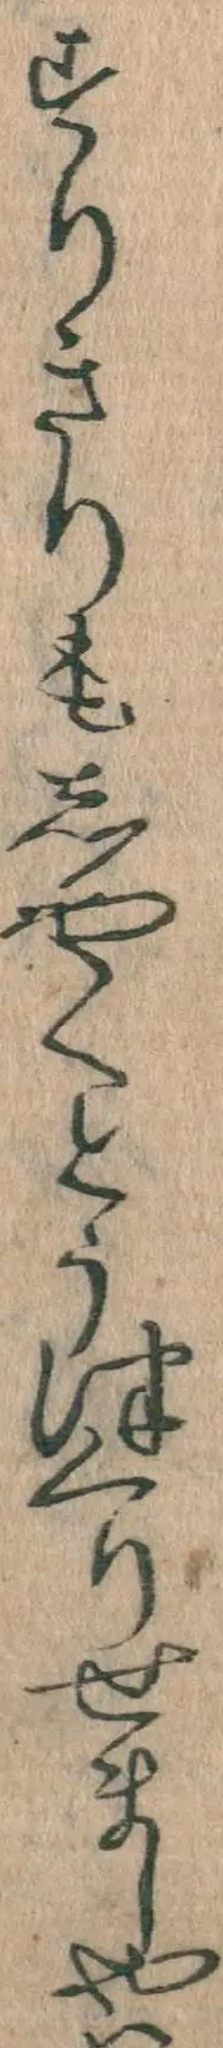すりきりもしやくとうつくりせましやは
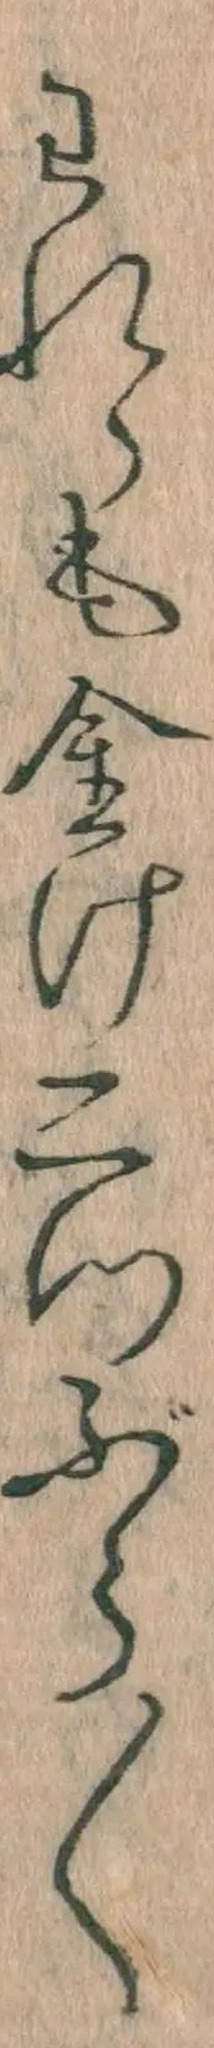われらも金け二つぶら〳〵
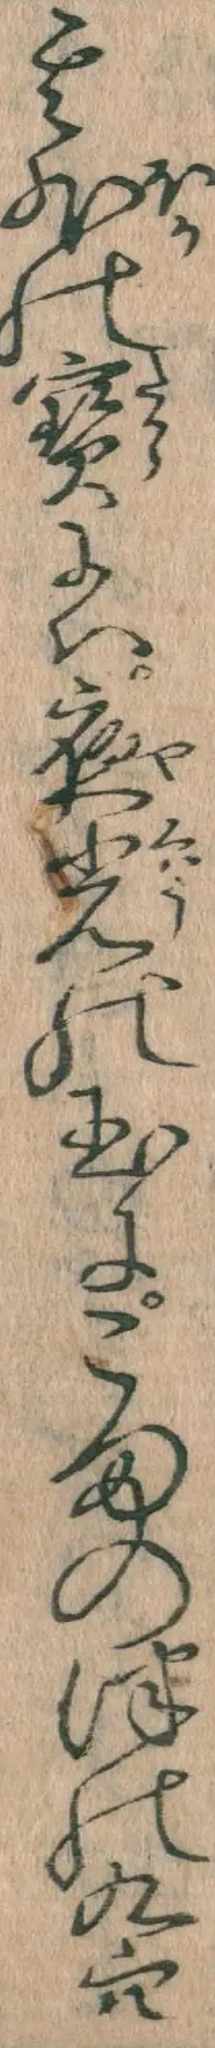其外の宝には。夜光の玉に。こまのつの九穴
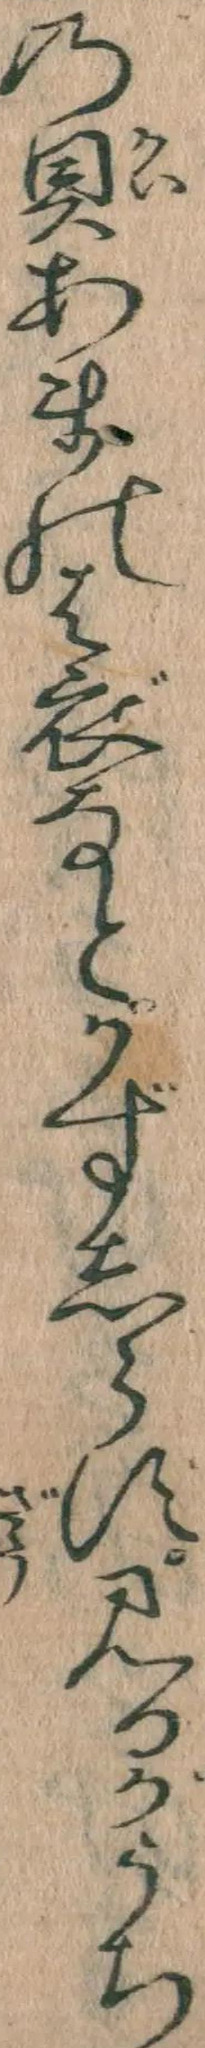の貝あまのは”衣なと。かずしらす。見るがうち
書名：竹斎狂歌物語 3巻
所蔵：国立国会図書館 National Diet Library, JAPAN
